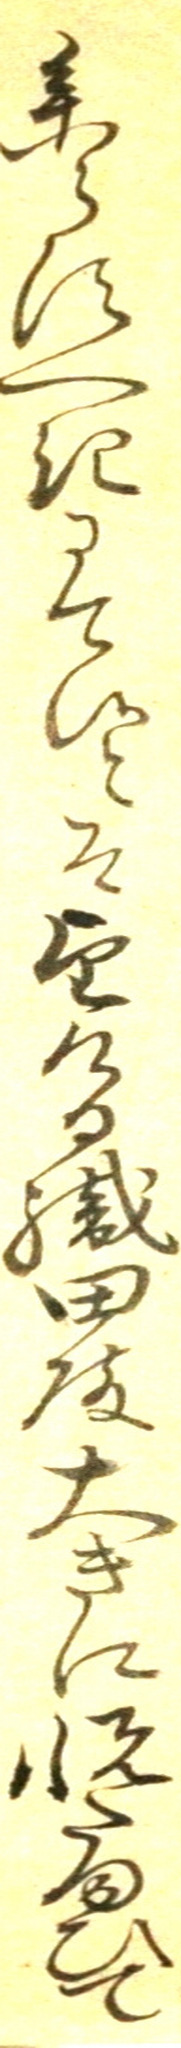参らすへきにて候とそ望ける織田殿大きに悦たまひて
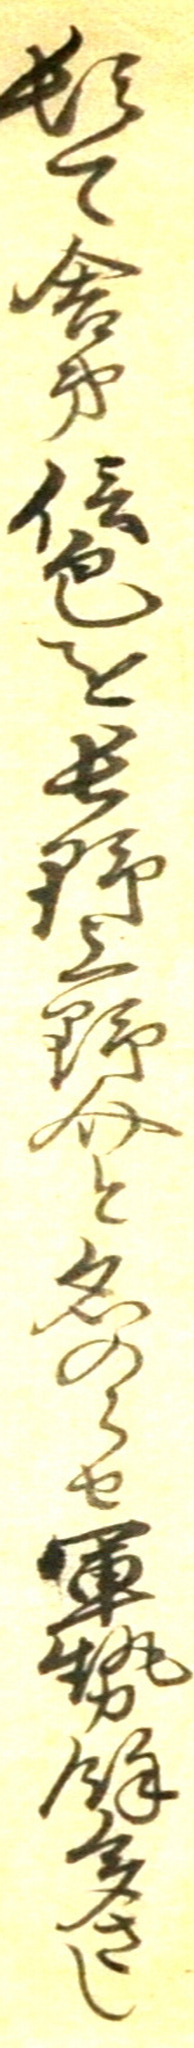頓て舎弟信包を長野上野介と名のらせ軍勢余多さし
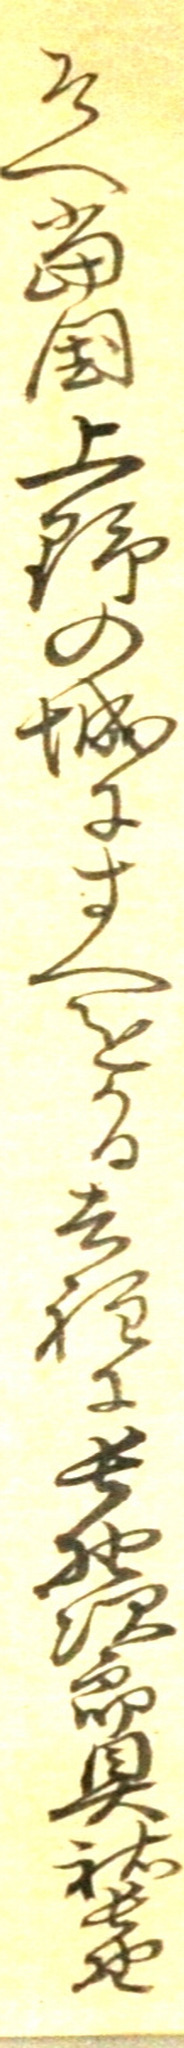そへ当国上野の城にすへをかる去程に長野次郎具祐長野
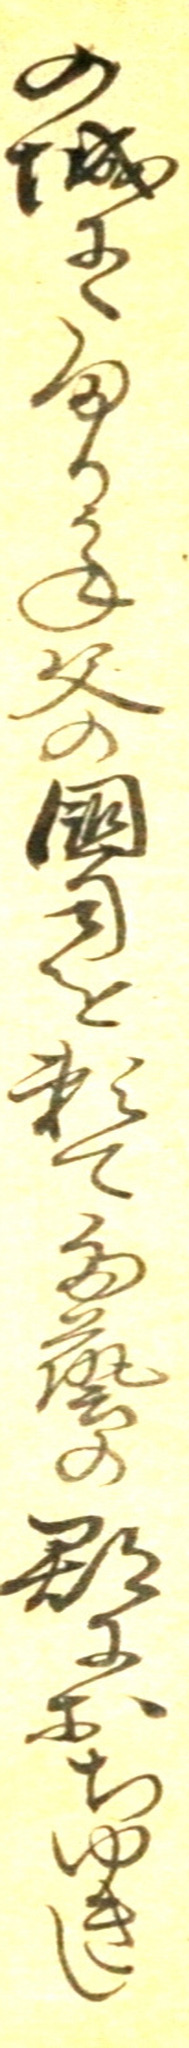の城にたまりかね父の国司を頼て多芸の郡におちゆきし
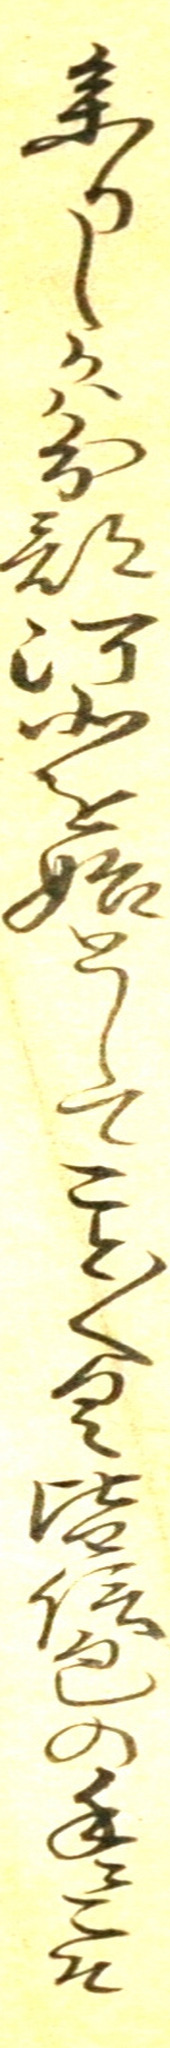参りしかは分部河北を始としてこと〳〵く皆信包の手にこそ
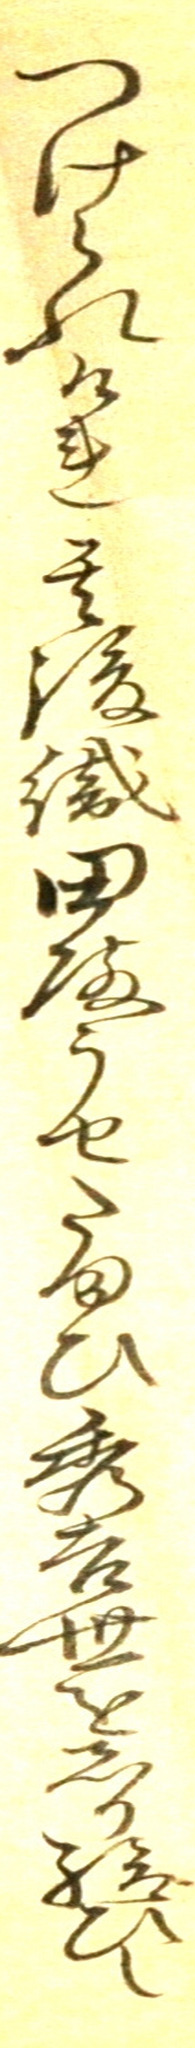つけられけれ其後織田殿うせたまひ秀吉世をしり給ひし
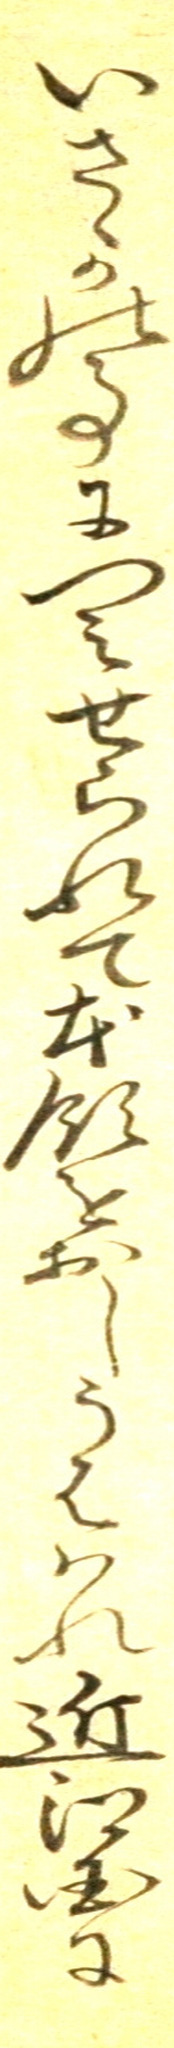いさゝかの事につみせられて本領をおしうははれ近江国に
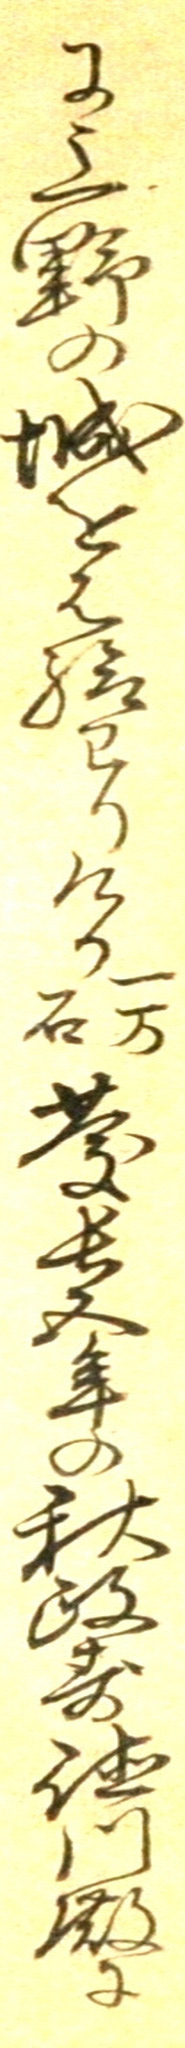に上野の城をは給わりけり一万石慶長五年の秋政寿徳川殿に
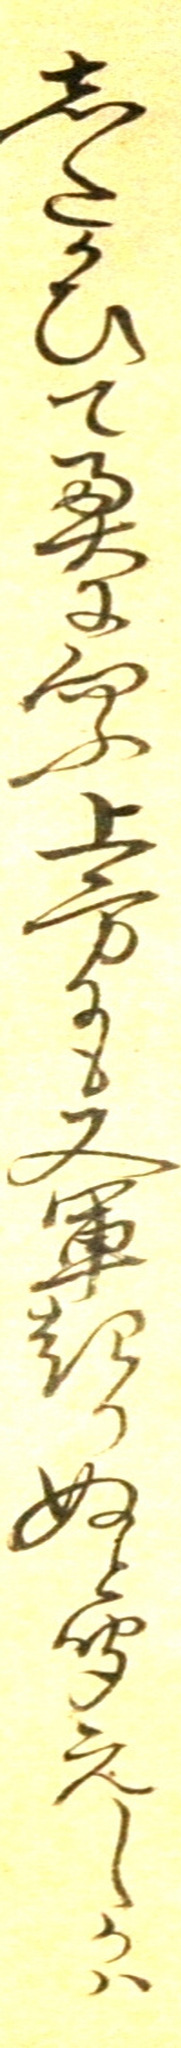したかひて奥に向ふ上方にも又軍起りぬと聞えしかは
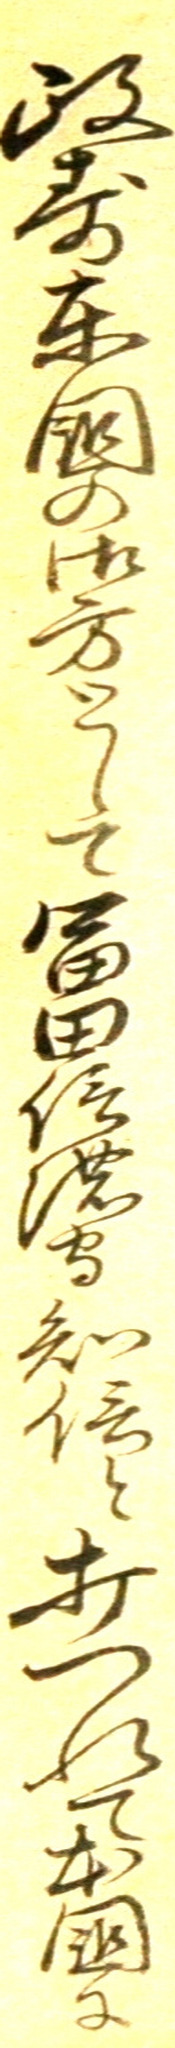政寿東国の御方として富田信濃守知信と打つれて本国に

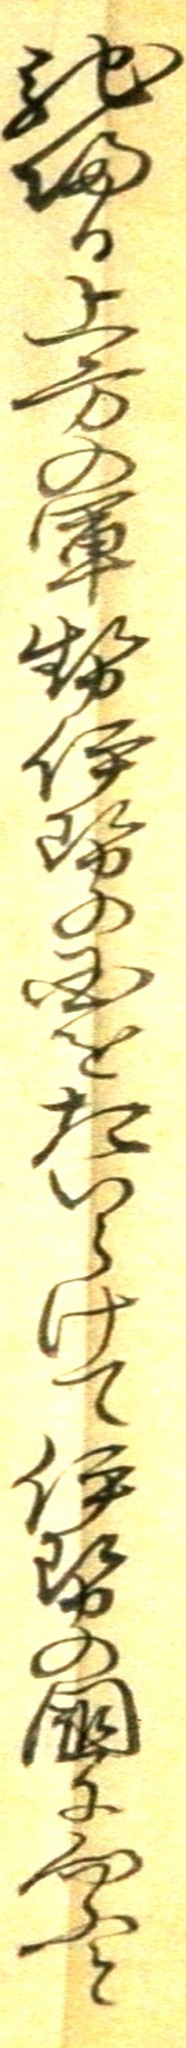馳帰る上方の軍勢伊勢の国をたいらけて伊勢の国に向ふと
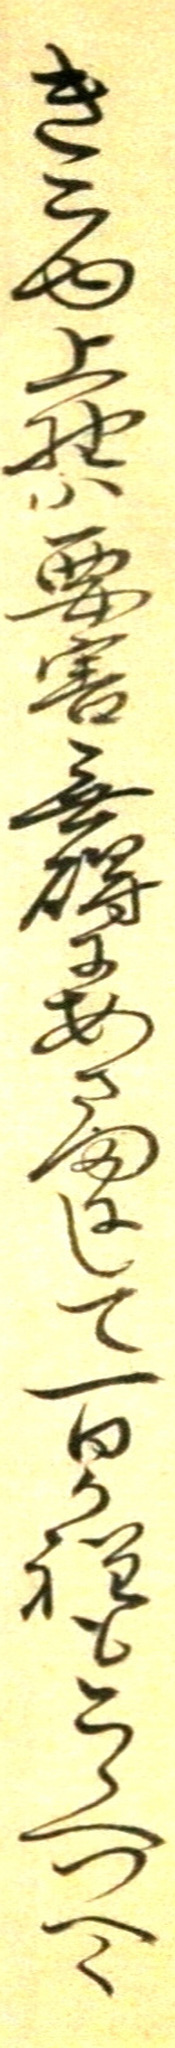きこゆ上野は要害無碍にあさまにして一日か程もこらへつへく
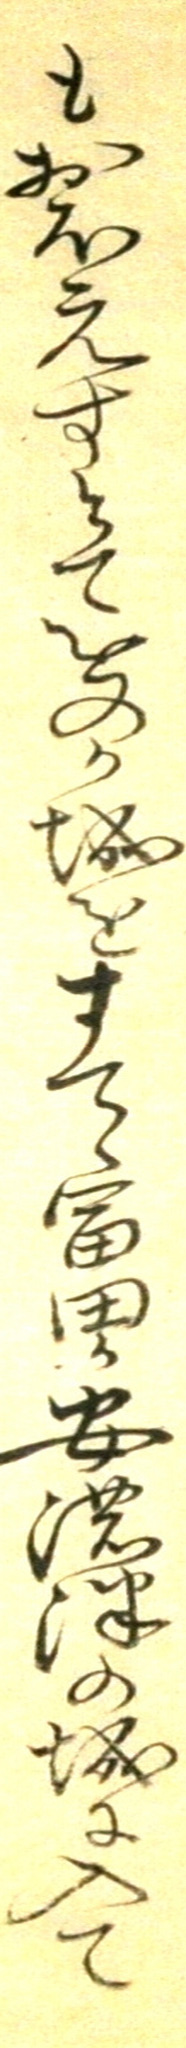もおほえすとてをのか城をすてゝ富田か安濃津の城に入て
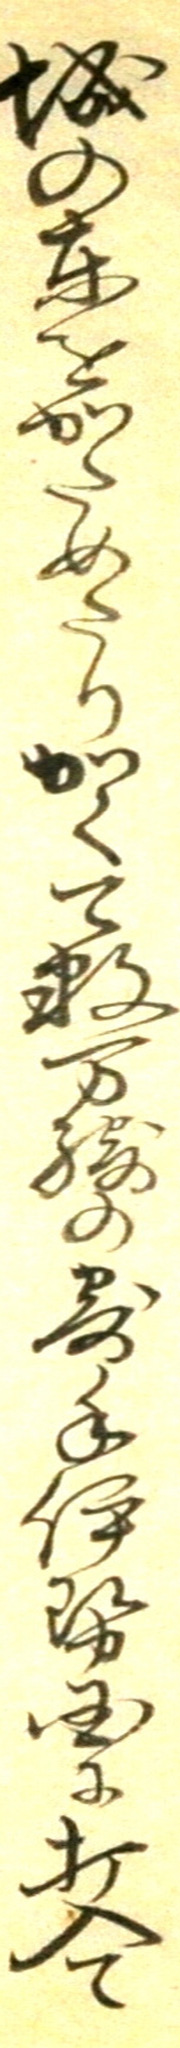城の東をかためたりかくて数万騎の寄手伊勢国に打入て
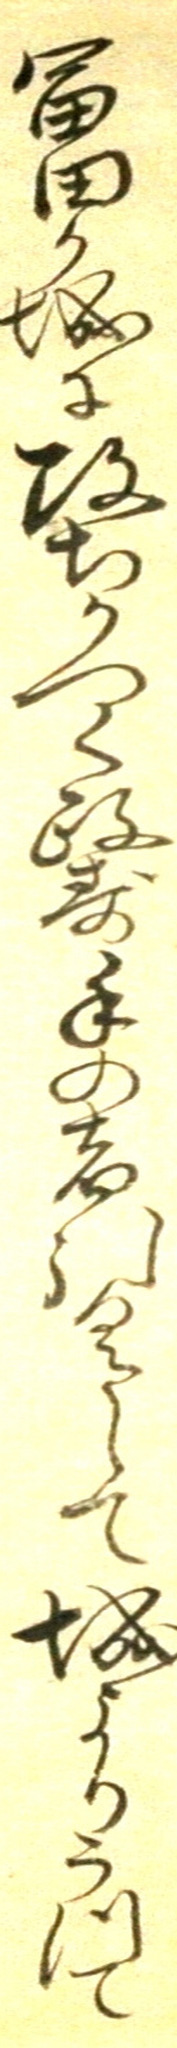富田か城に攻ちかつく政寿手の者引具して城よりうつて
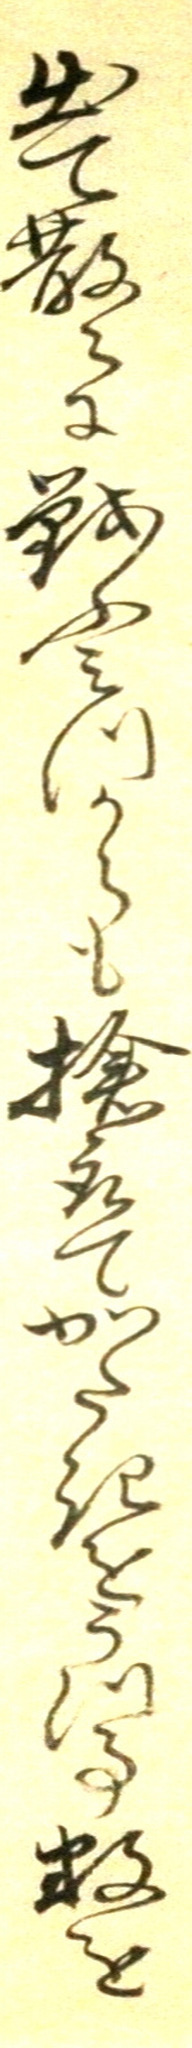出て散々に戦ふみつからも槍取てかたきをうつ事数を
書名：藩翰譜（九・上）
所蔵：伊那市立高遠町図書館・合同会社AMANE
